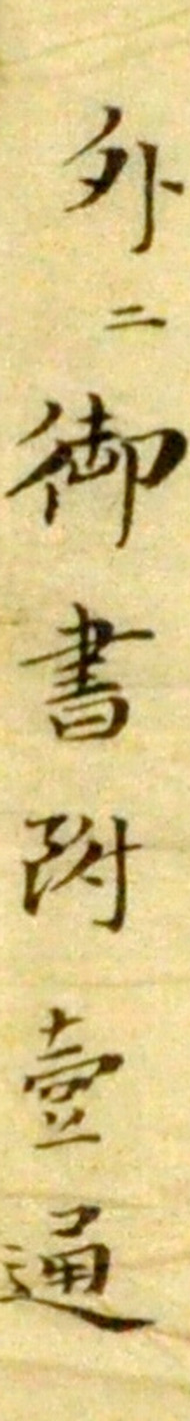外に御書附壱通

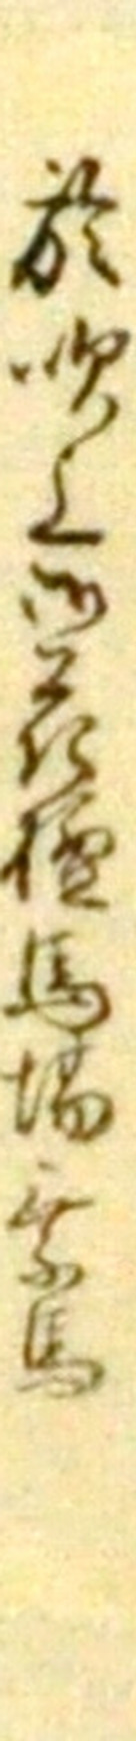於吹上御花檀馬場乗馬
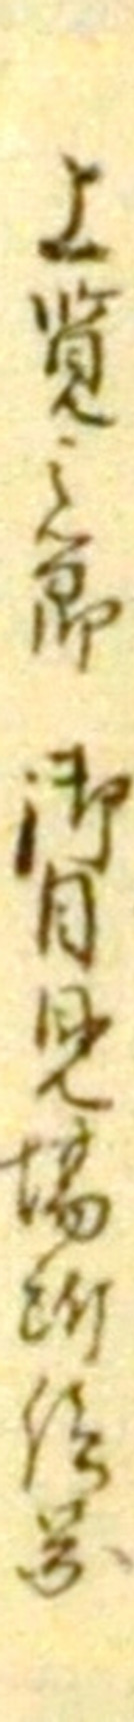上覧之節御目見場所絵図

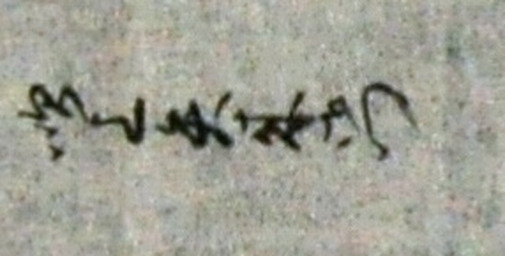吹上矢来御門
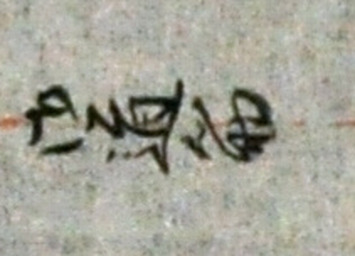御道筋
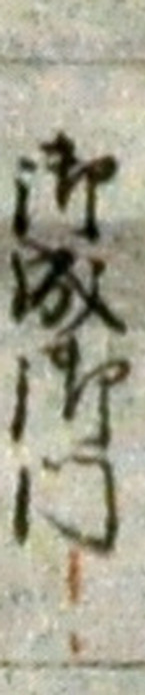御成御門
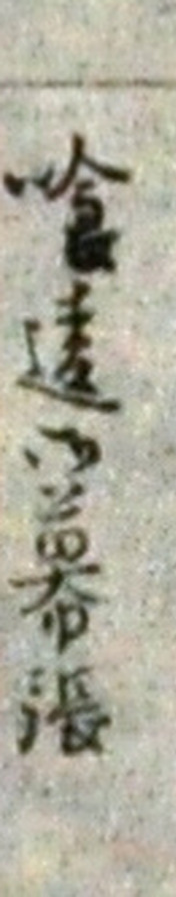喰違御幕張
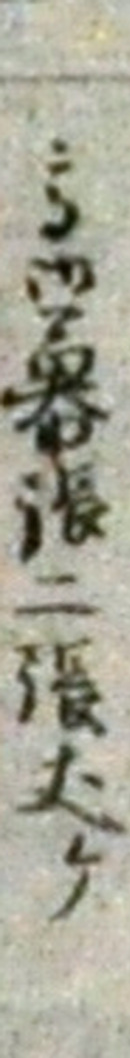高御幕張ニ張丈ケ

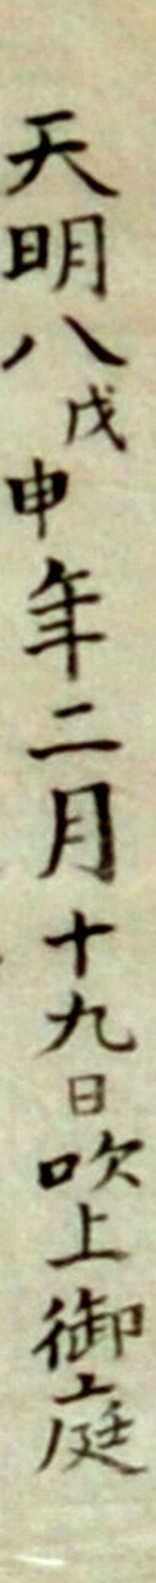天明八戊申年二月十九日吹上御庭
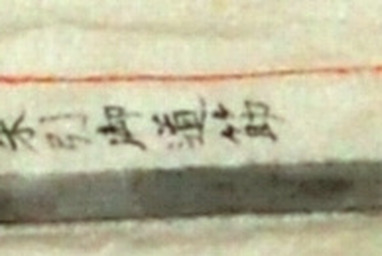朱引御道筋
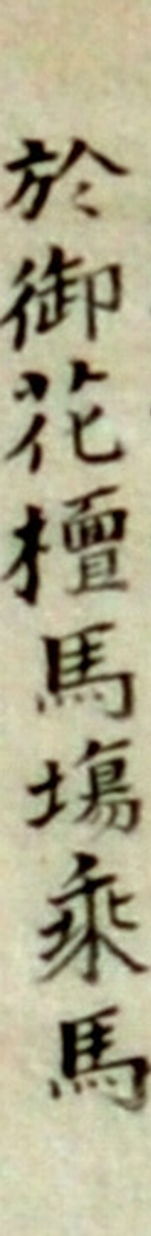於御花檀馬場乗馬
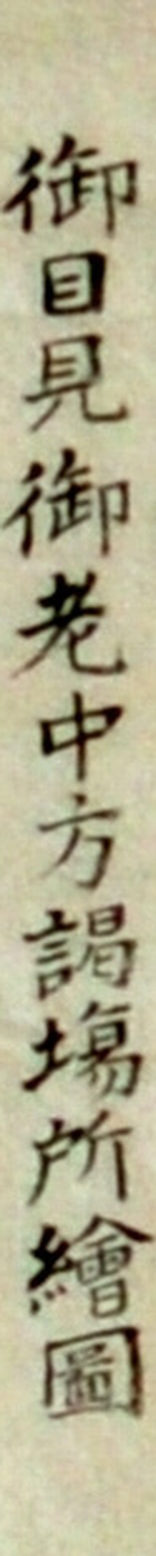御目見御老中方謁場所絵図
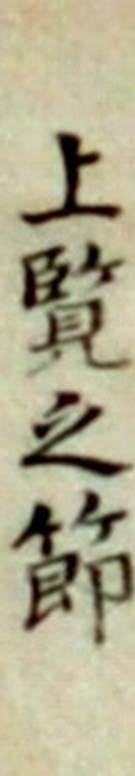上覧之節

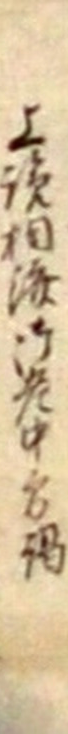上覧相済御老中方謁
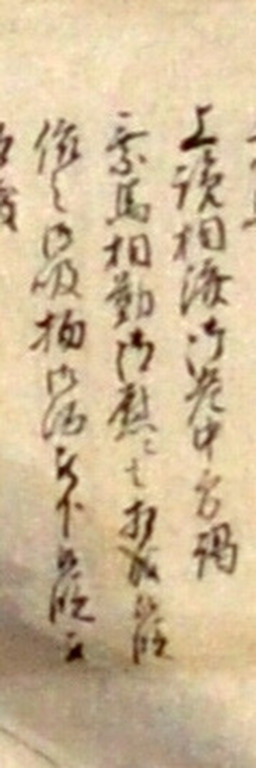乗馬相勤御慰にも相成候段
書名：吹上御庭ニ於テ乗馬上覧ノ節留書外
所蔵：伊那市立高遠町図書館・合同会社AMANE
